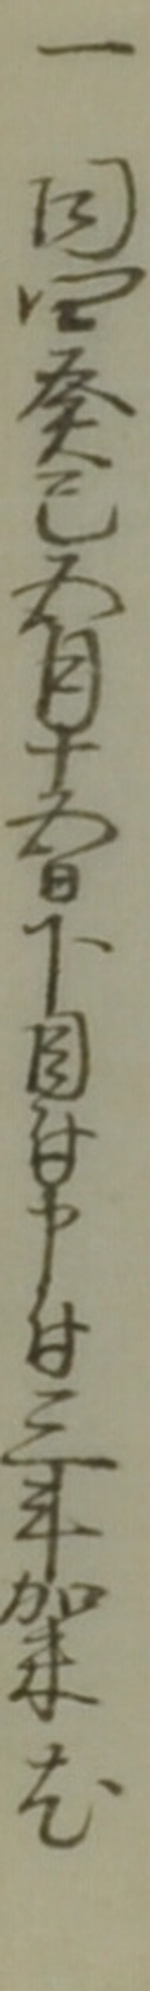一同四癸巳五月十五日下目付申付三斗加米尤
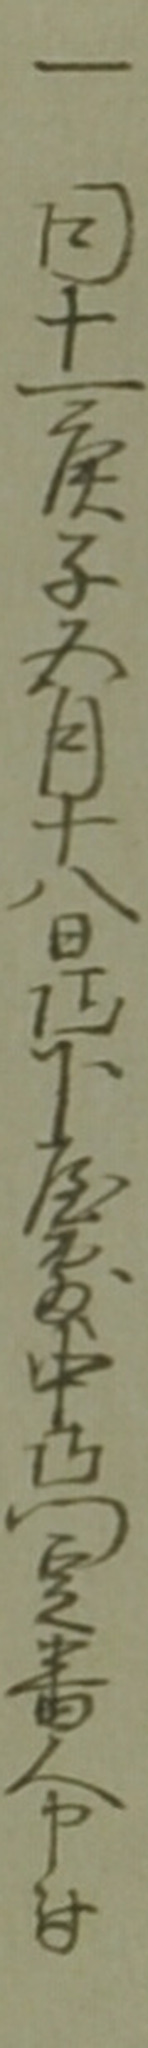一同十一庚子五月十八日御下屋敷中御門定番人申付
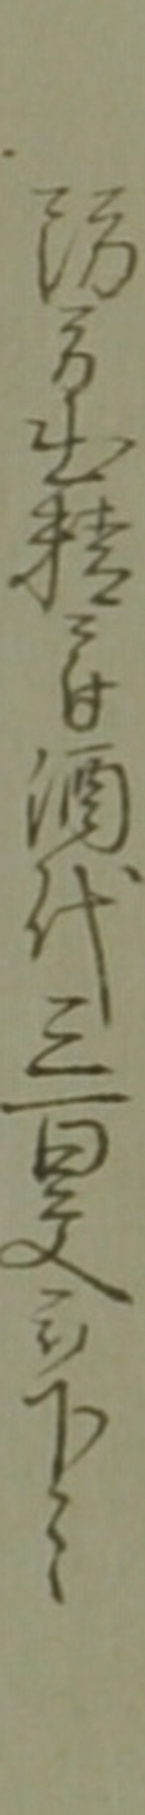防方出精ニ付酒代三百文被下之
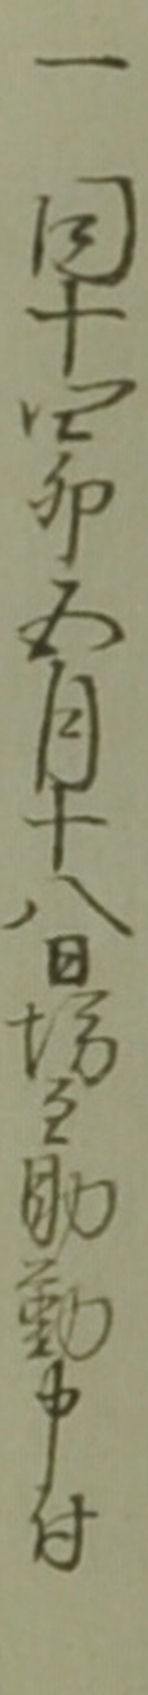一同十四卯五月十八日坊主助勤申付
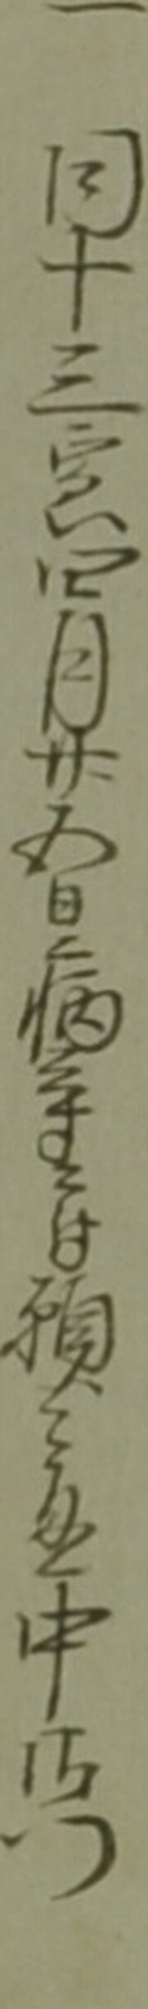一同十三寅四月廿五日病気ニ付願之通中御門
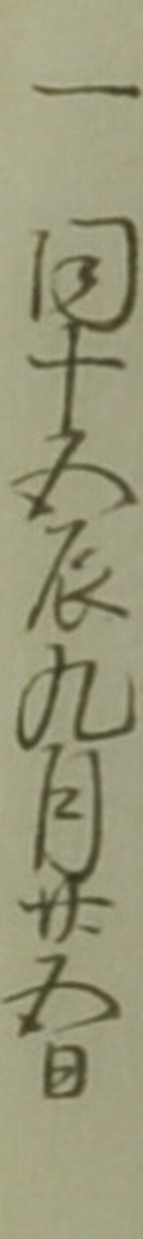一同十五辰九月廿五日

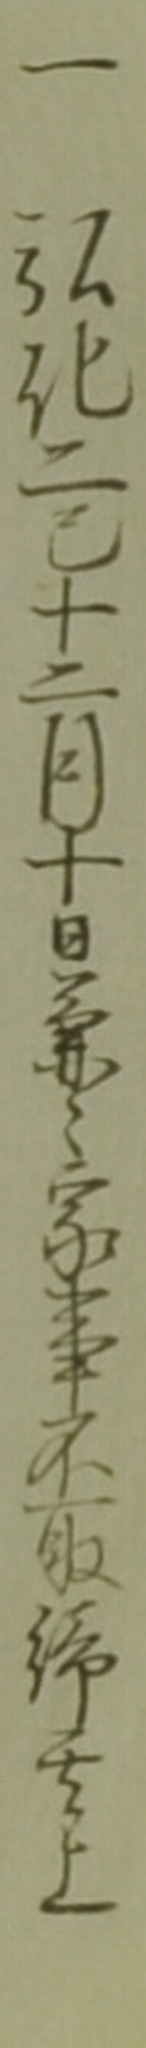一弘化二巳十二月十日兼々家事不取締其上
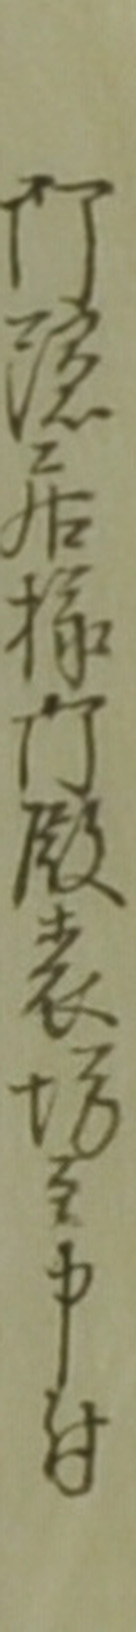御隠居様御殿表坊主申付
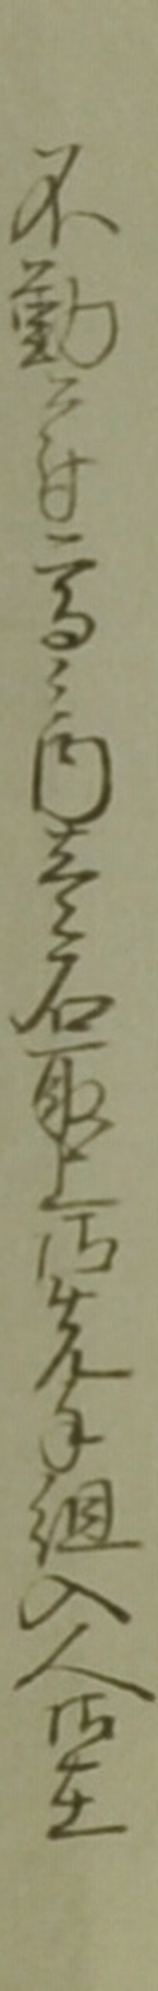不勤ニ付高之内壱石取上御先手組入人御在

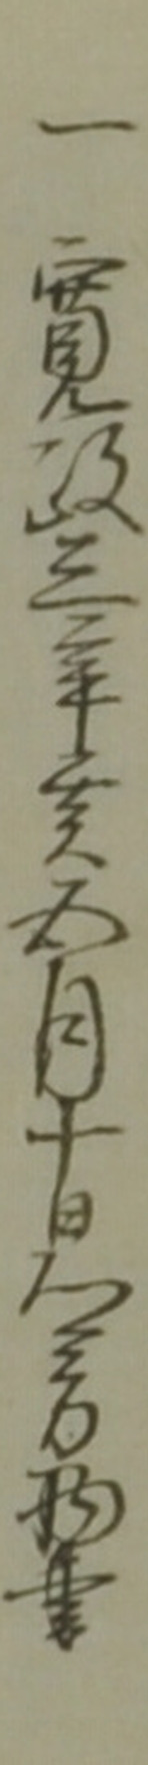一寛政三辛亥五月十日郷組方物書
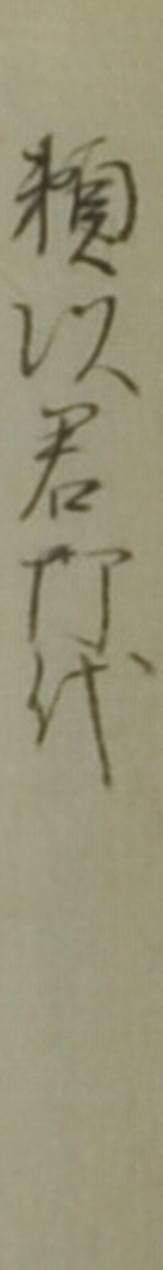頼以君御代
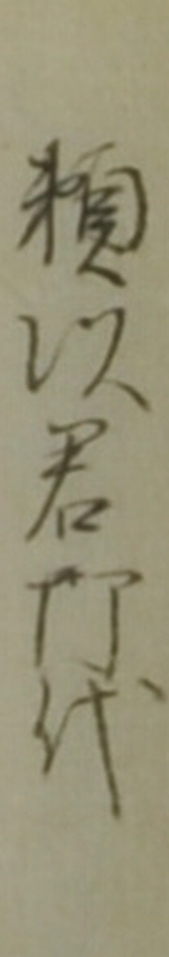頼以君御代
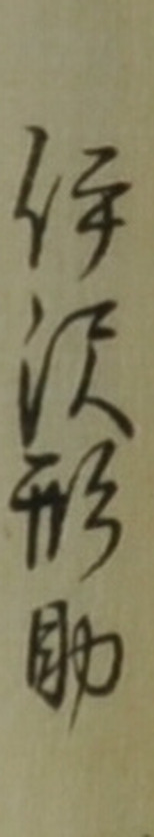伊沢形助
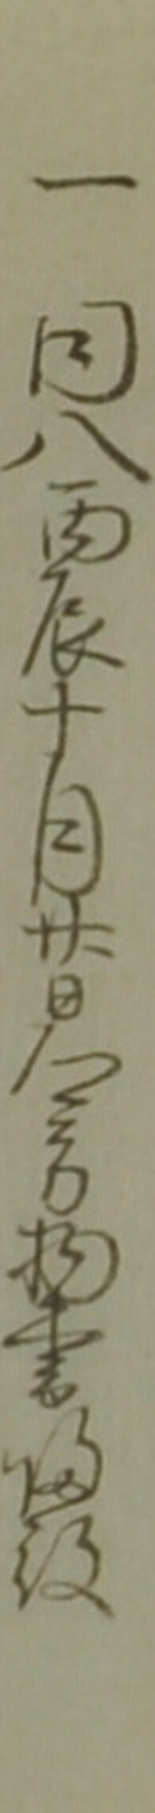一同八丙辰十月廿日郷組物書帰役
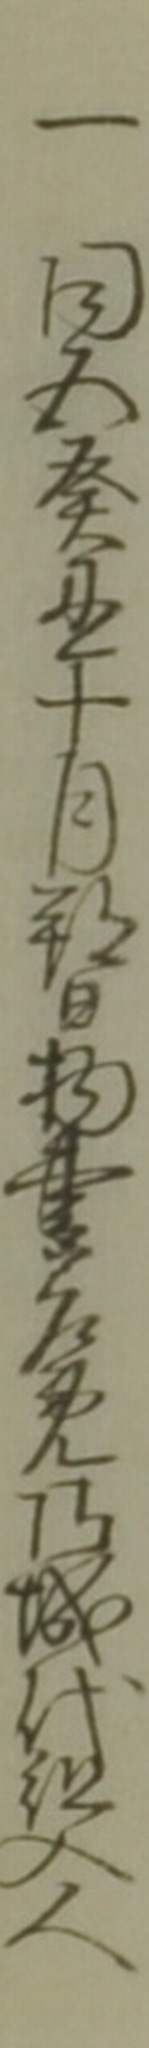一同五癸丑十月朔日物書差免御城代組入人
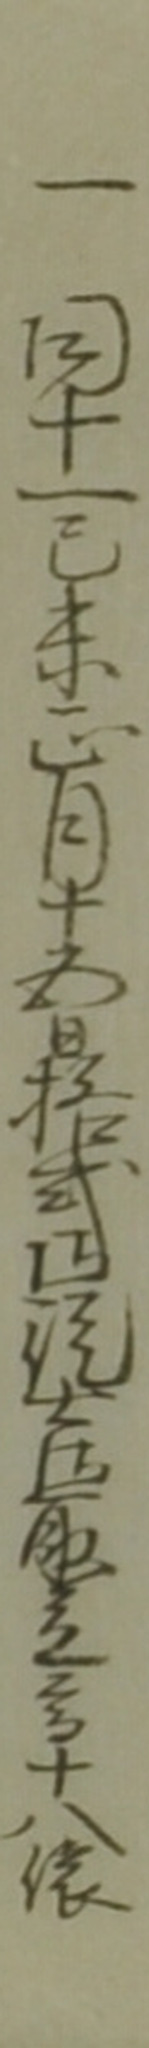一同十一己未正月十五日格式御徒士御取立高十八俵
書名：無足諸士勤仕録（九）
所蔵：伊那市立高遠町図書館・合同会社AMANE
